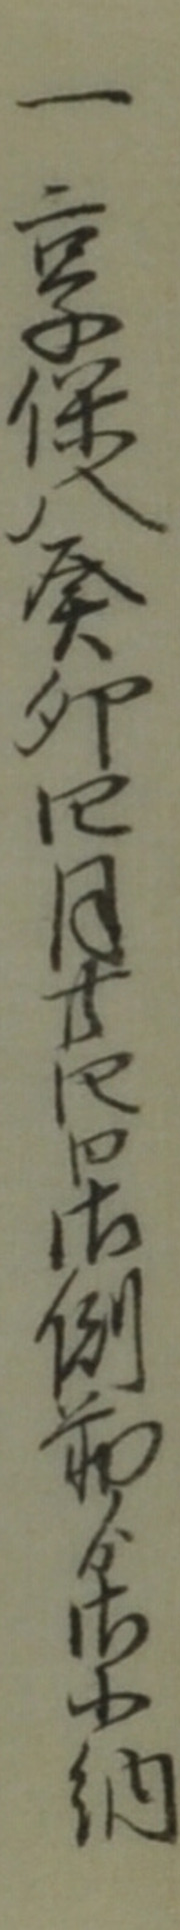一享保八癸卯四月廿四日御側勤ゟ御小納
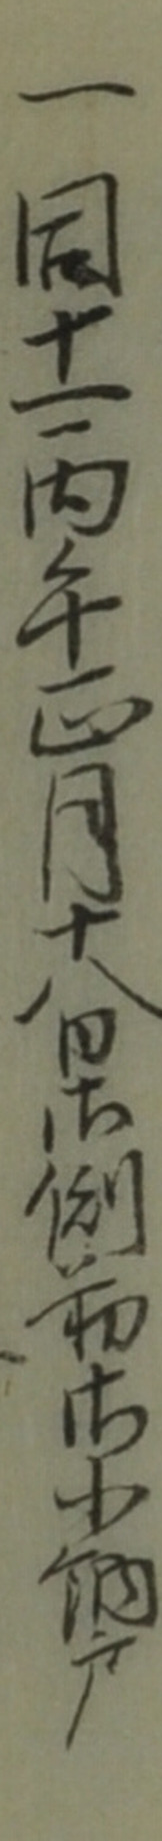一同十一丙午誌正月十八日御側勤御小納戸
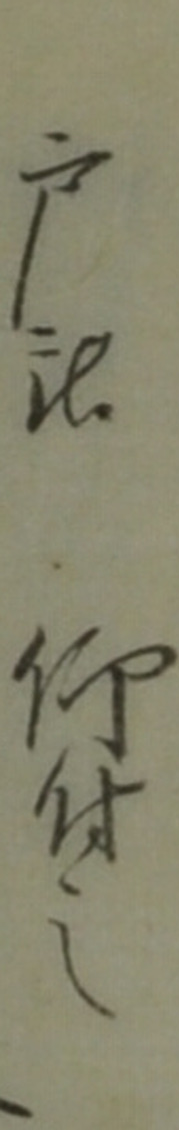戸被仰付之
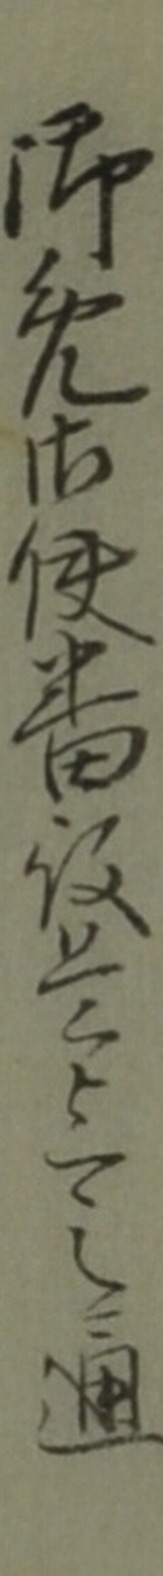御免御使番役是迄之通
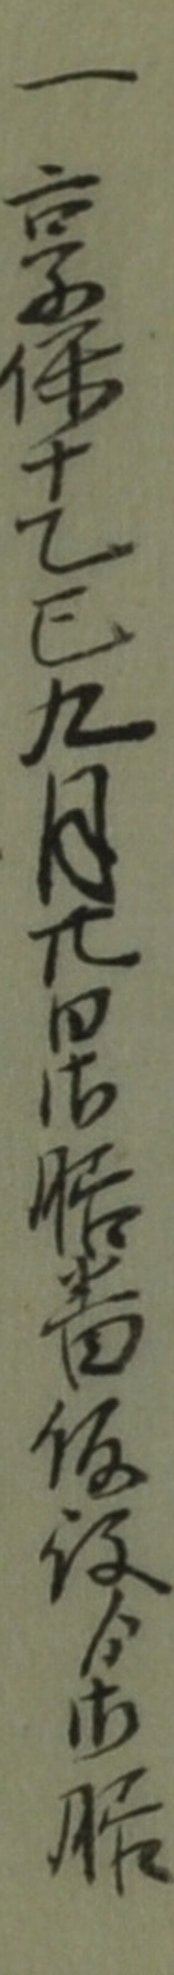一享保十乙巳九月廿日御膳番仮役ゟ御膳
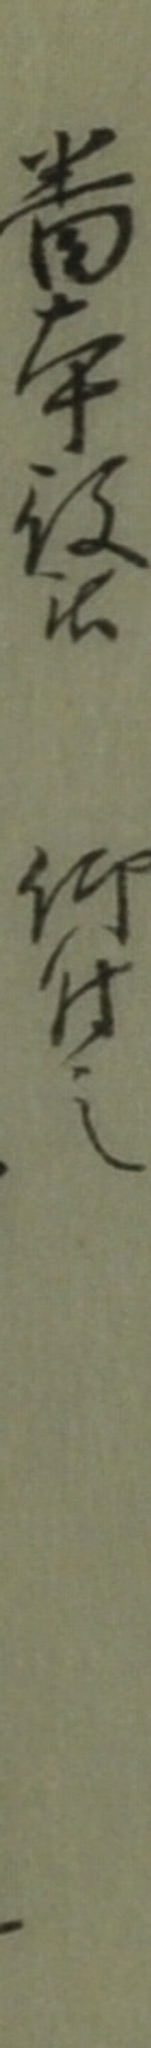番本役被仰付之
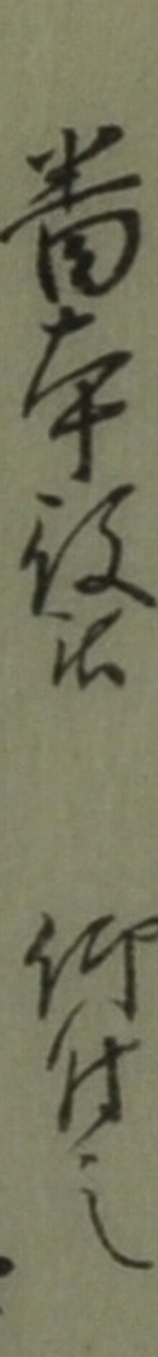番本役被仰付之
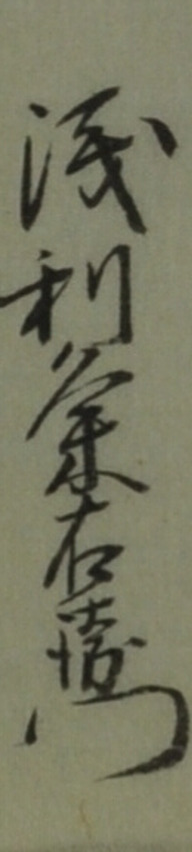浅利粂右衛門
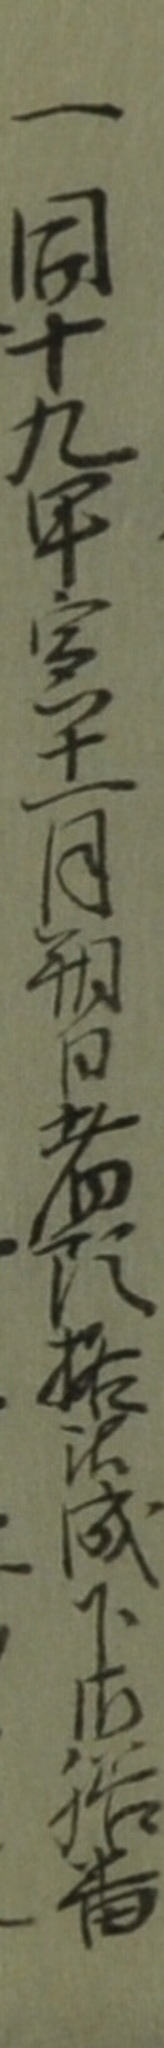一同十九甲寅十一月朔日者頭格被成下御膳番
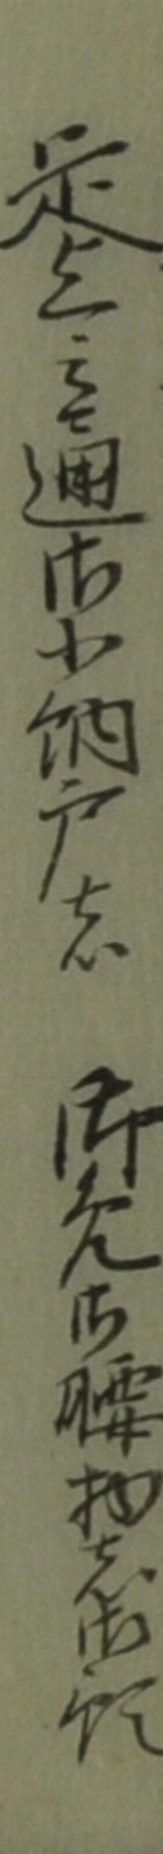是迄之通御小納戸者御免御腰物者御預
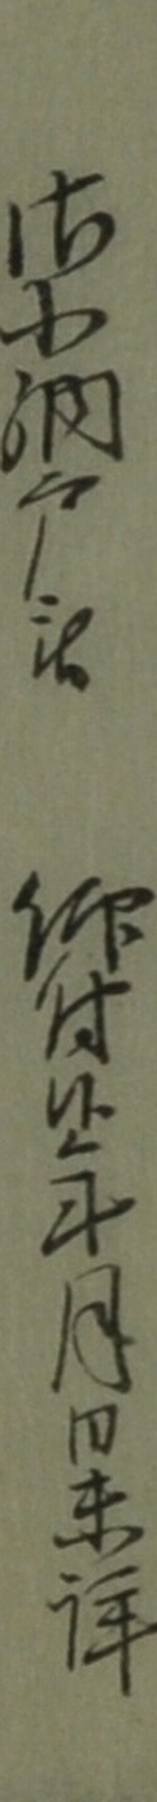仰付小納戸被仰付候年月日未詳
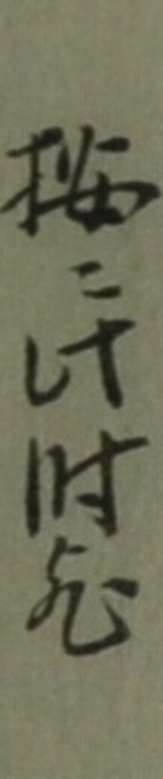按ニ此時欤

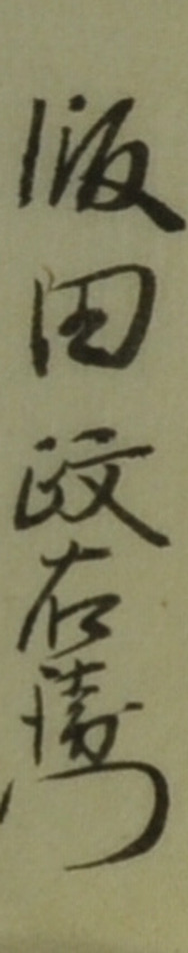飯田政右衛門
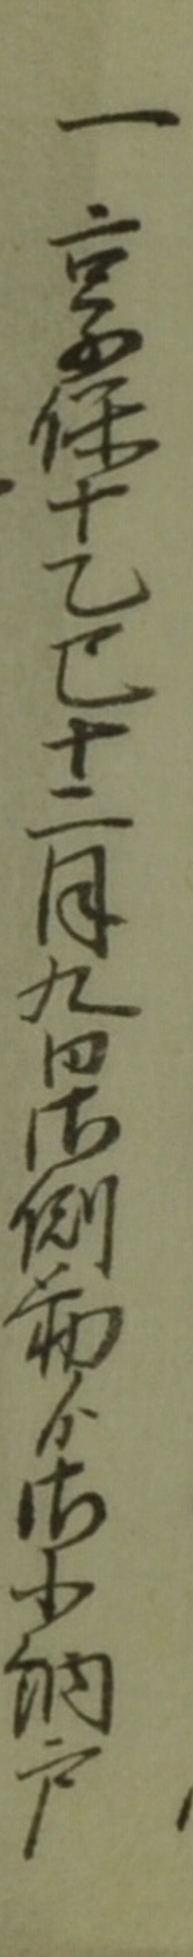一享保十乙巳十二月九日御側勤ゟ御小納戸
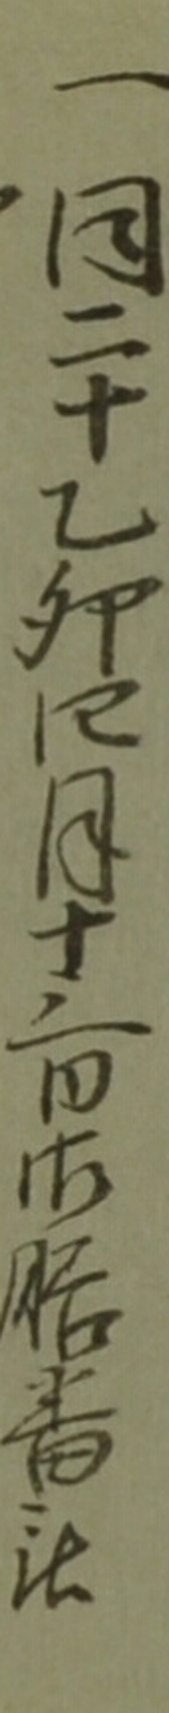一同二十乙卯四月十三日御膳番被
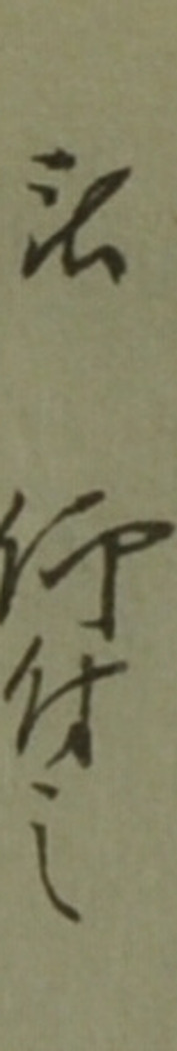被仰付之
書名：諸御役代々録（四）
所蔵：伊那市立高遠町図書館・合同会社AMANE
